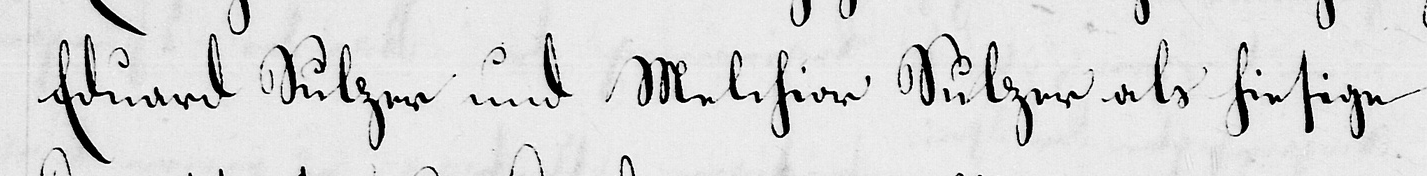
Eduard Sulzer und Melchior Sulzer als hiesige
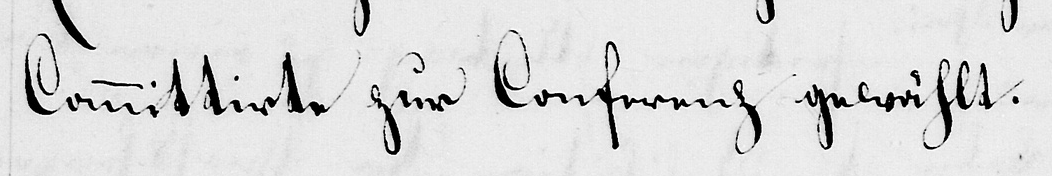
Committirte zur Conferenz gewählt.
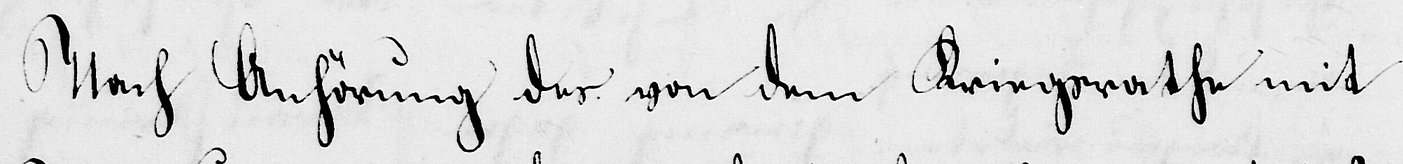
Nach Anhörung des von dem Kriegsrathe mit
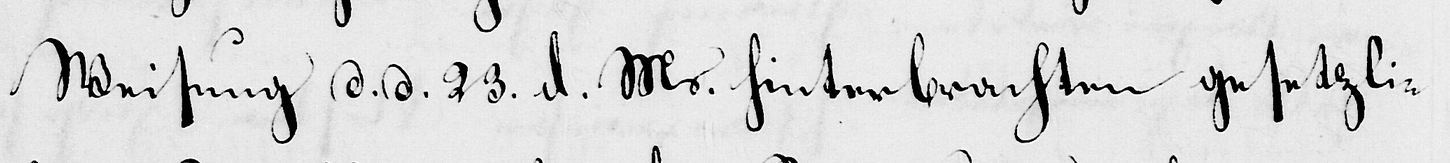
Weisung d. d. 23. d. Ms. hinterbrachten gesetzli¬
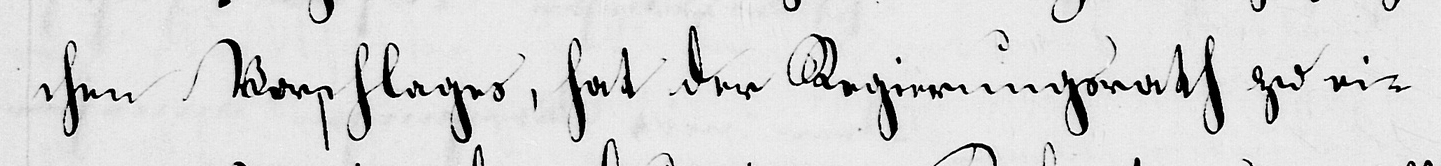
chen Vorschlages, hat der Regierungsrath zu ei¬
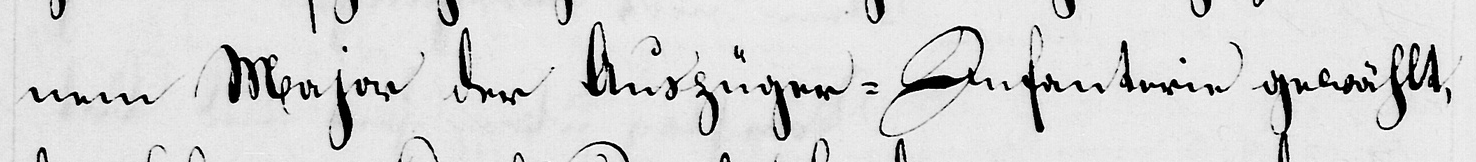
nem Major der Auszüger-Infanterie gewählt,
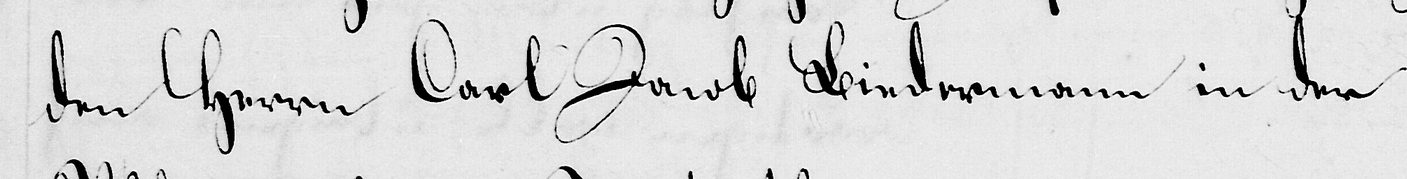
den Herrn Carl Jacob Biedermann in der
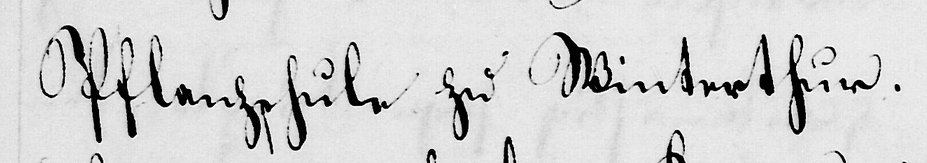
Pflanzschule zu Winterthur.
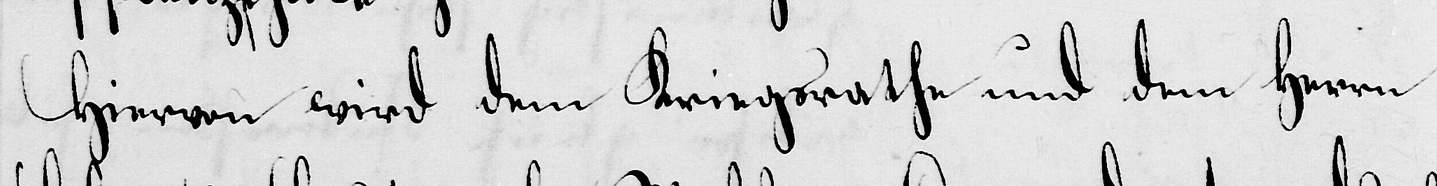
Hiervon wird dem Kriegsrathe und dem Herrn
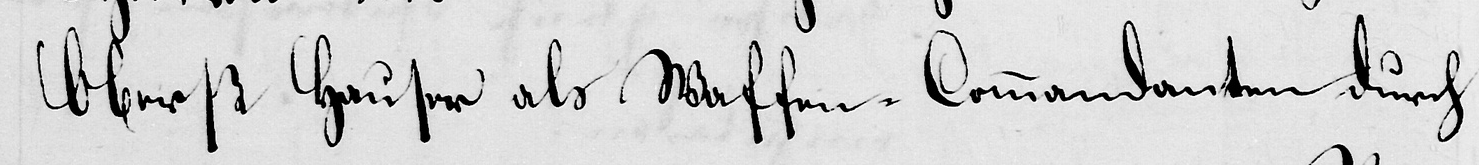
Oberst Hauser als Waffen-Commandanten durch
